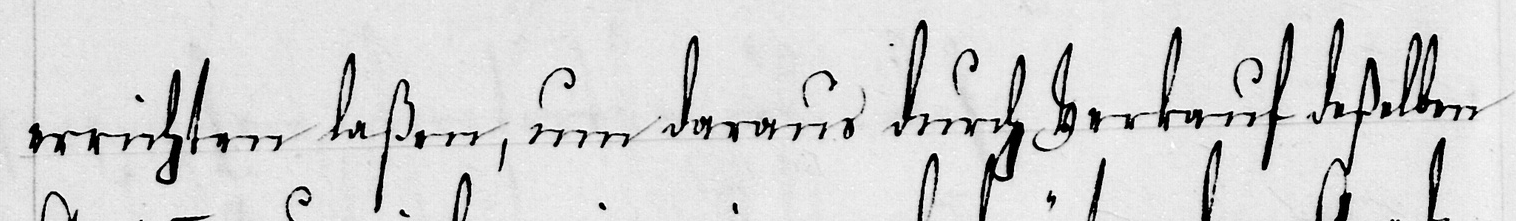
errichten laßen, um daraus durch Verkauf deßelben
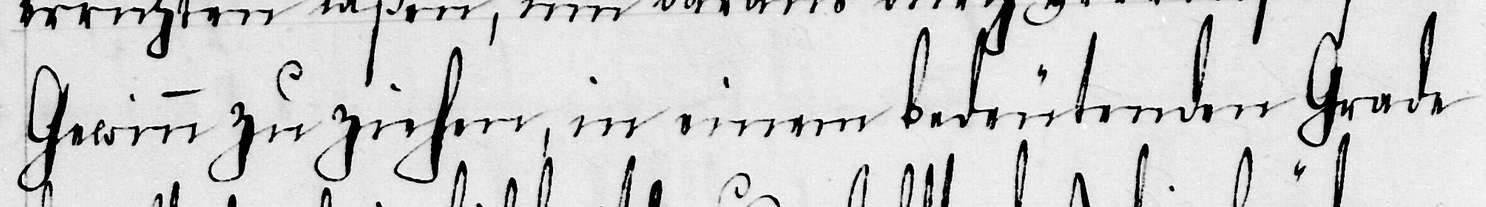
Gewinn zu ziehen, in einem bedeutenden Grade
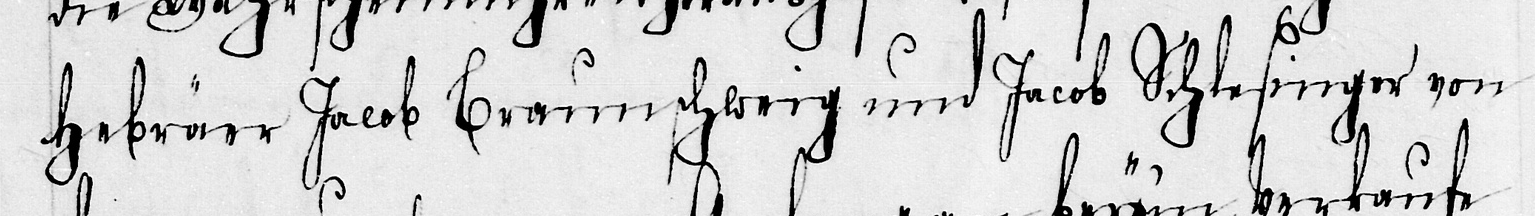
Hebräer Jacob Braunschweig und Jacob Schlesinger von
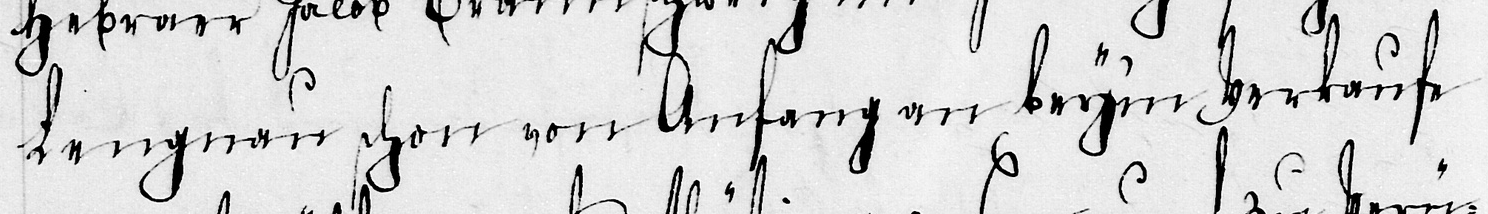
Lengnau schon von Anfang an bey’m Verkaufe
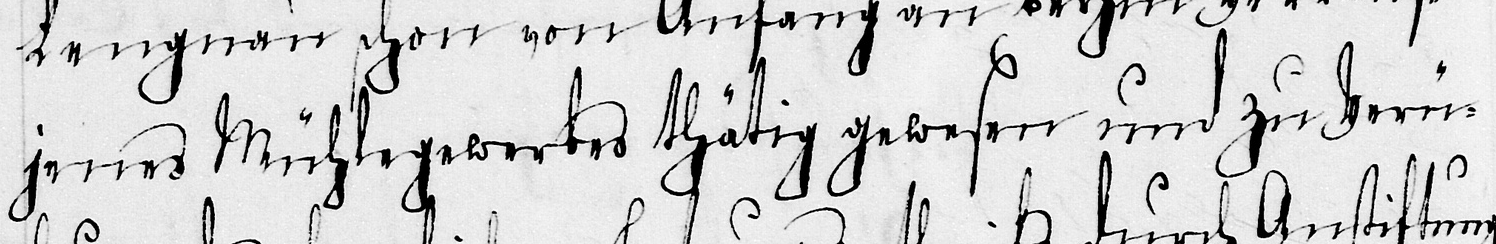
jenes Mühlegewerbes thätig gewesen und zu Verü¬
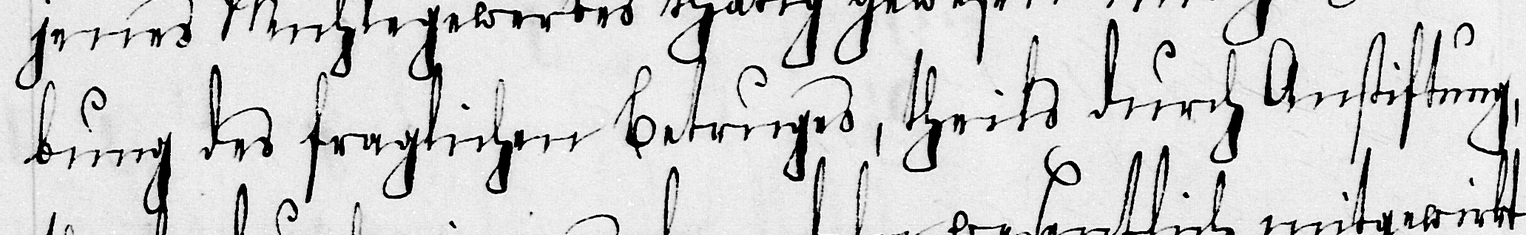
bung des fraglichen Betruges, theils durch Anstiftung,
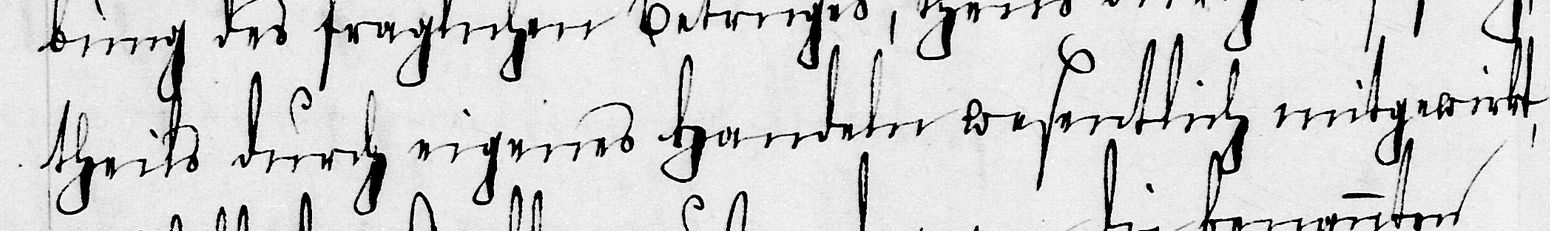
theils durch eigenes Handeln wesentlich mitgewirkt,
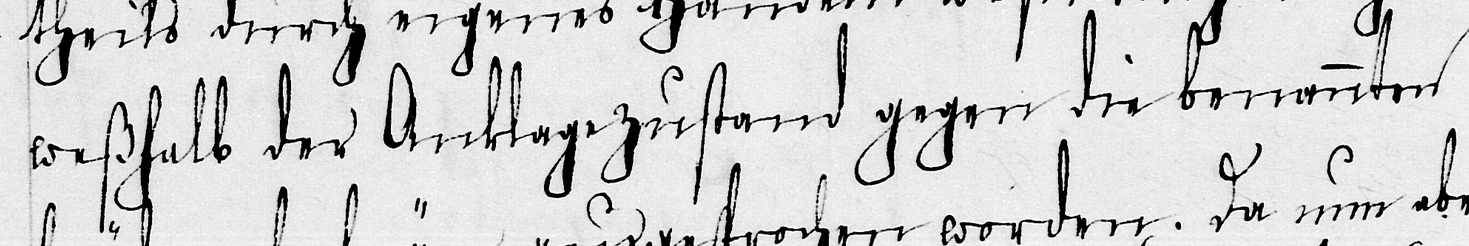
weßhalb der Anklagezustand gegen die benannten
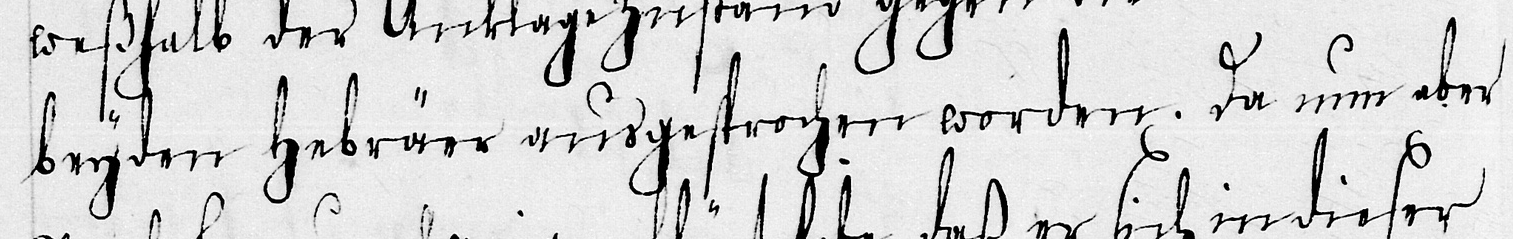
beyden Hebräer ausgesprochen worden. Da nun aber
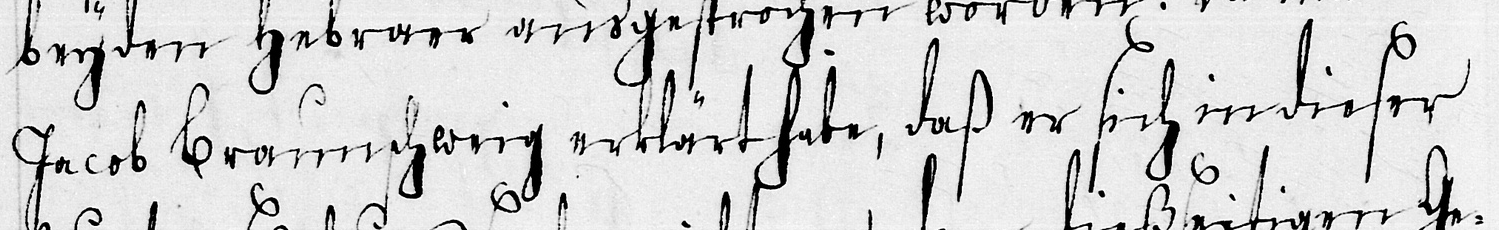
Jacob Braunschweig erklärt habe, daß er sich in dieser
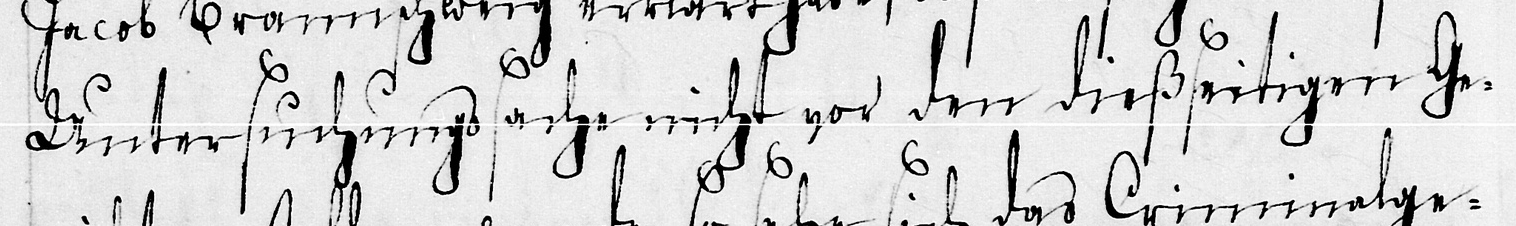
Untersuchungssache nicht vor den dießseitigen Ge¬
